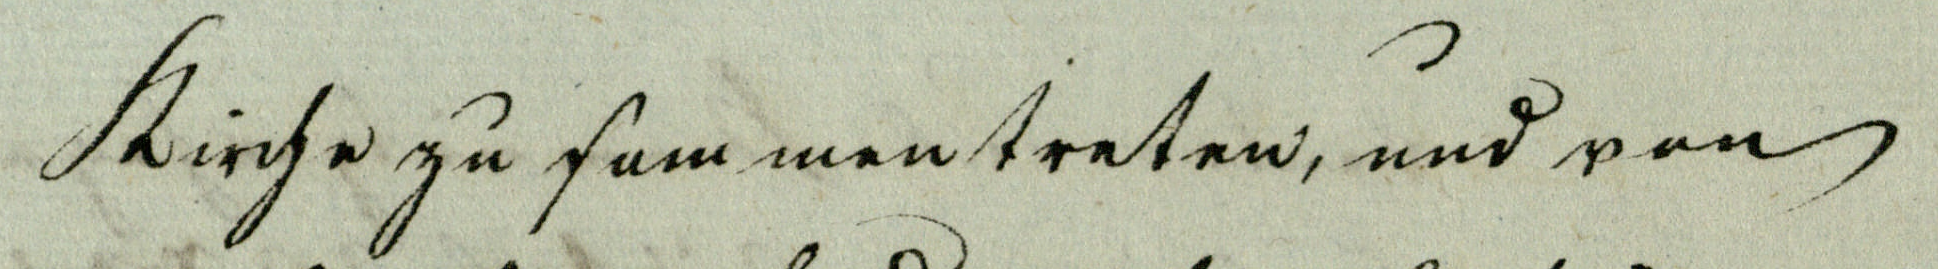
Kirche zu sammentreten, und von
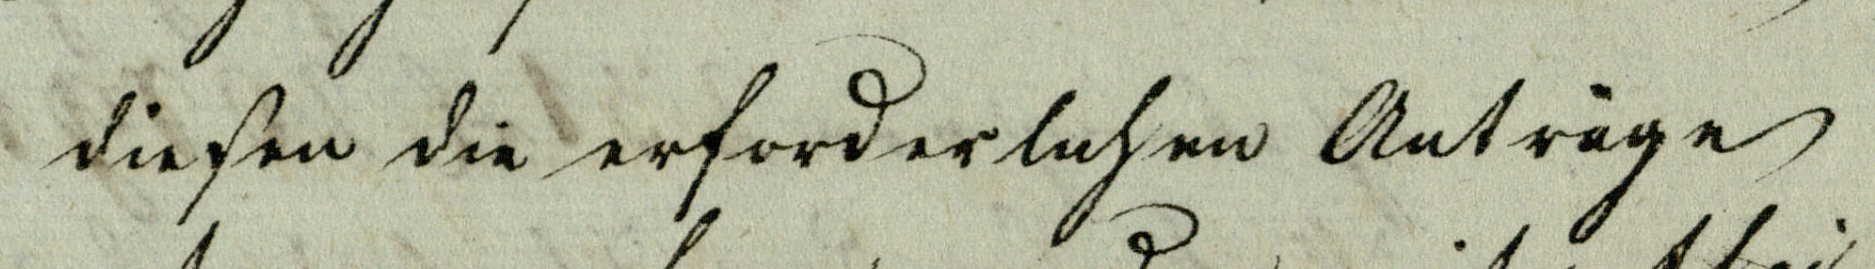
diesen die erforderlichen Anträge
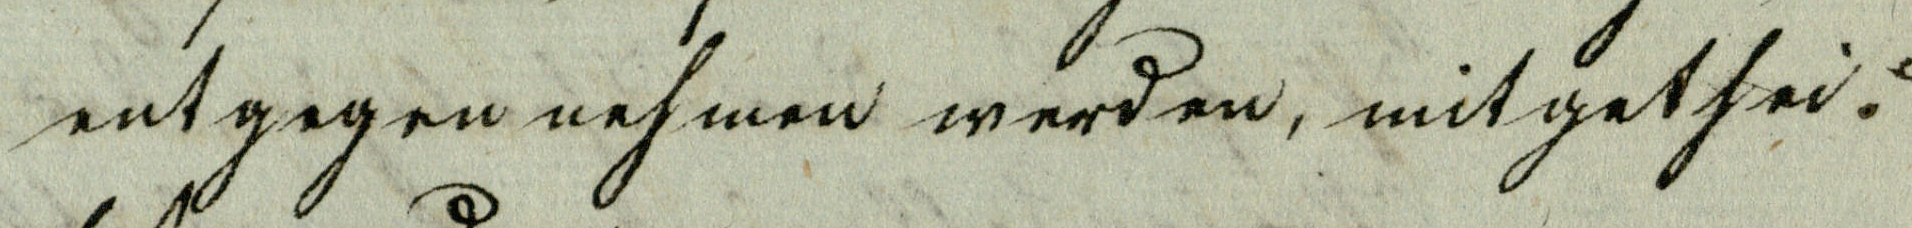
entgegen nehmen werden, mitgethei¬
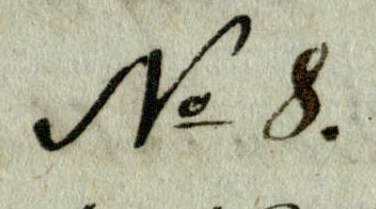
No 8.
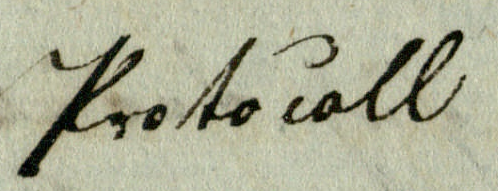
Protocoll
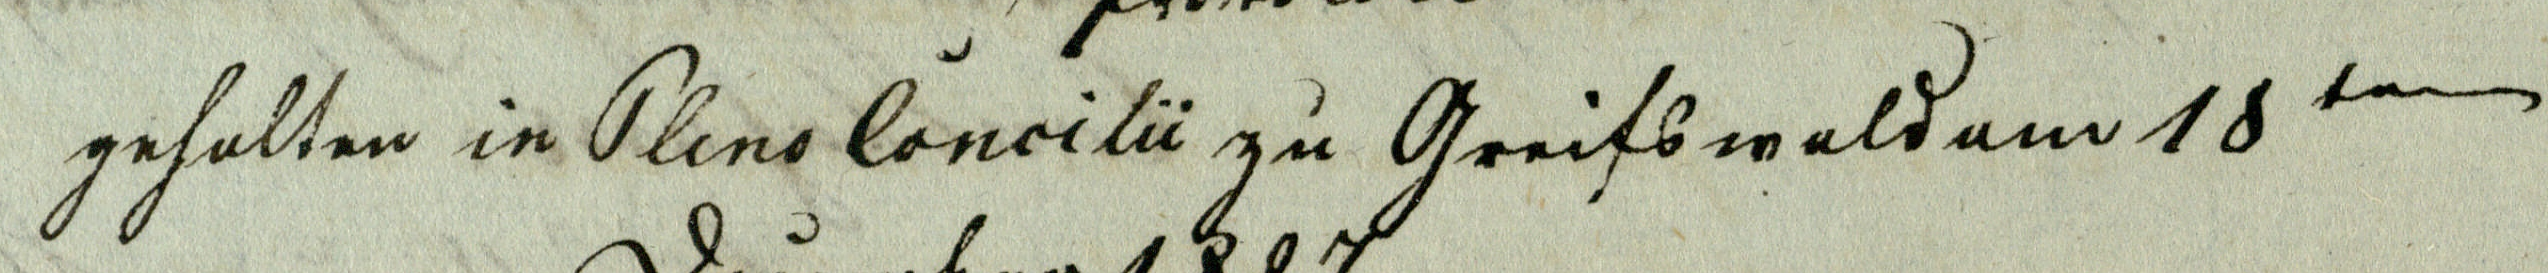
gehalten in Pleno Concilii zu Greifswald am 18 ten
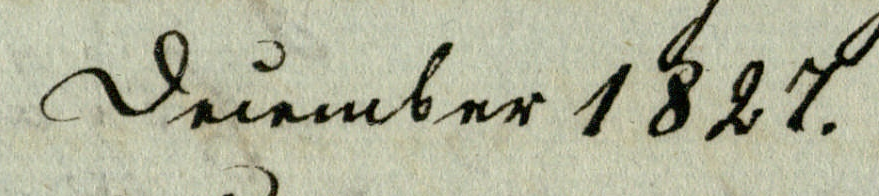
December 1827.
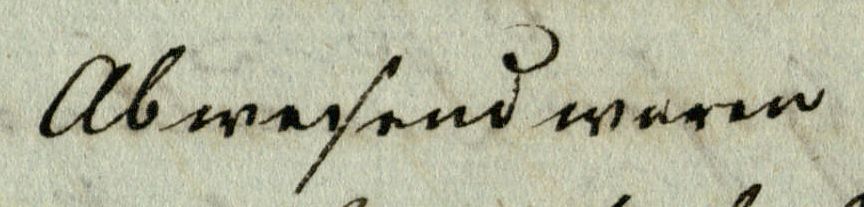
Abwesend waren
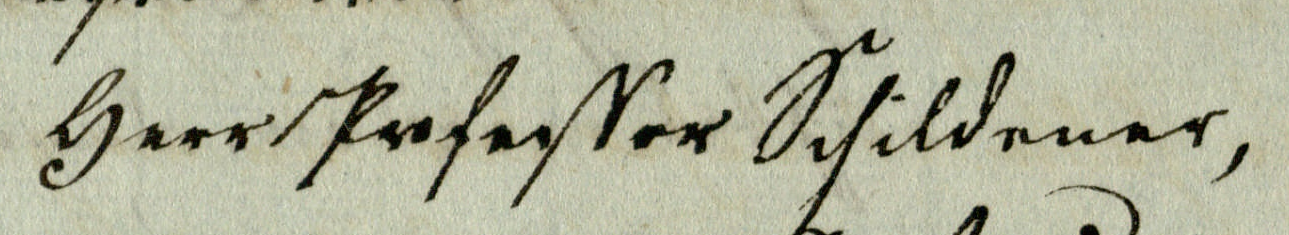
Herr Professor Schildener,
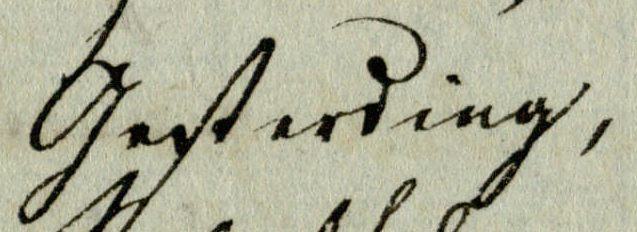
Gesterding,
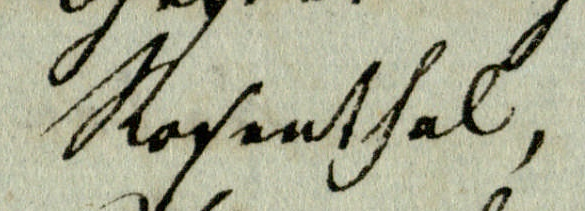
Rosenthal,
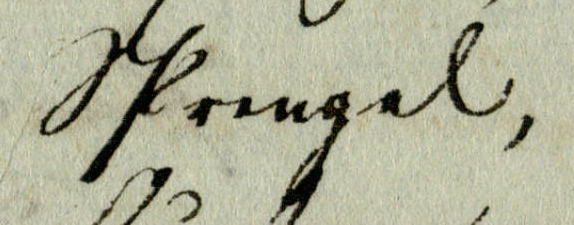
Sprengel,
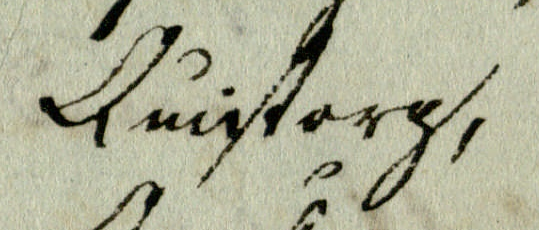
Quistorp,
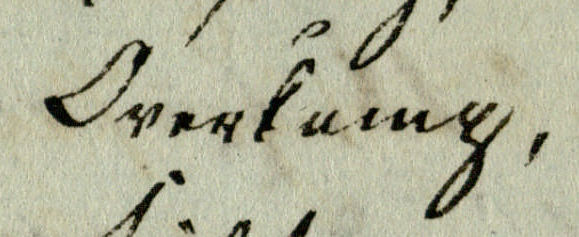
Overkamp,
